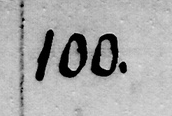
140.
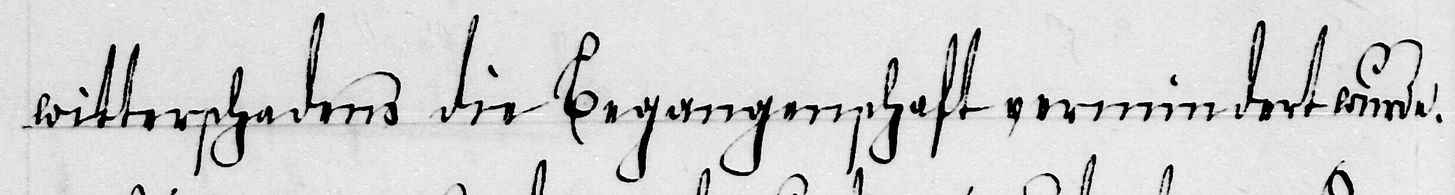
witterschadens die Begangenschaft vermindert wurde.
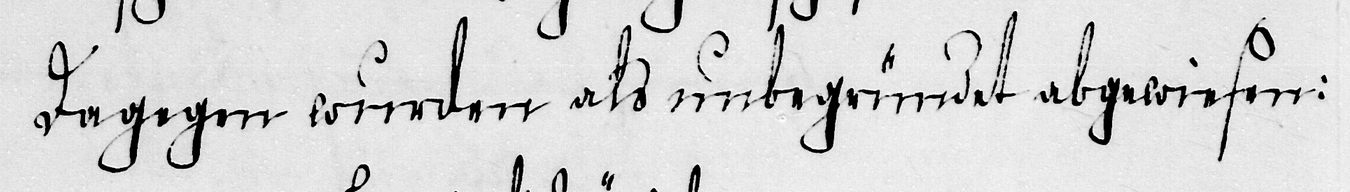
Dagegen wurden als unbegründet abgewiesen:
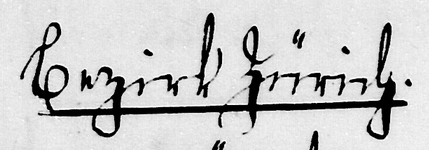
Bezirk Zürich.
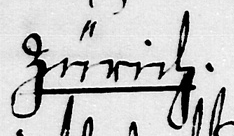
Zürich.
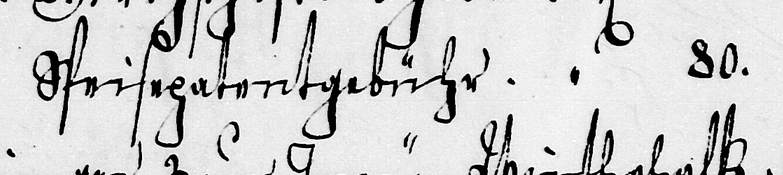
Speisepatentgebühr “ 80.
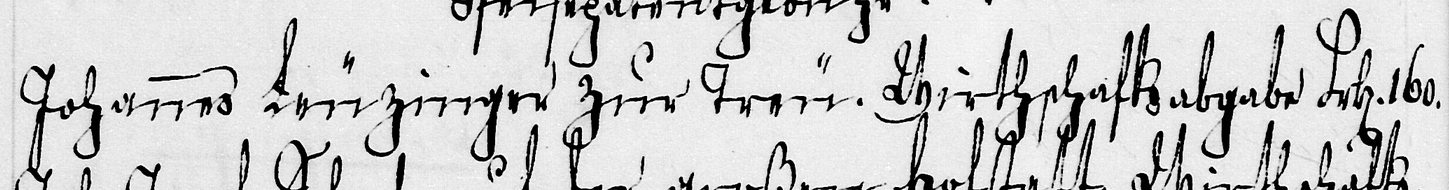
Johannes Leuzinger zur Treu. Wirthschaftsabgabe Frk[en].
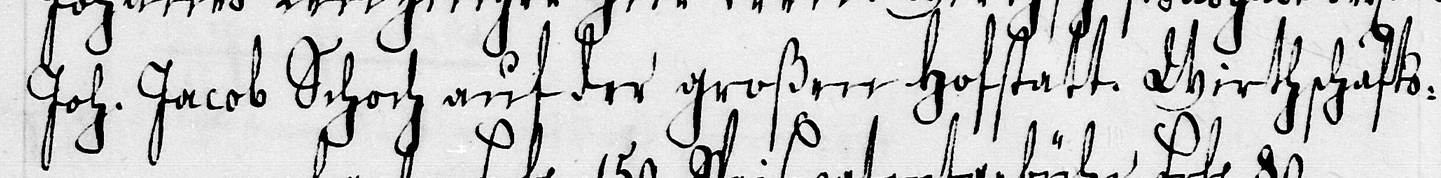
Joh. Jacob Schoch auf der großen Hofstatt. Wirthschafts¬
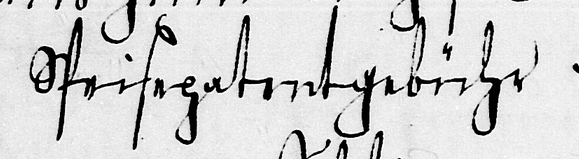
Speisepatentgebühr
